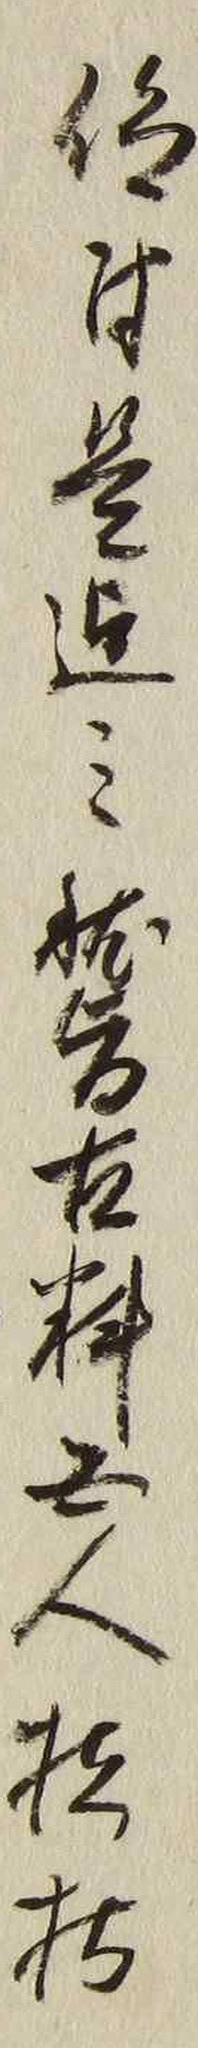仰付是迄之稽古料五人扶持
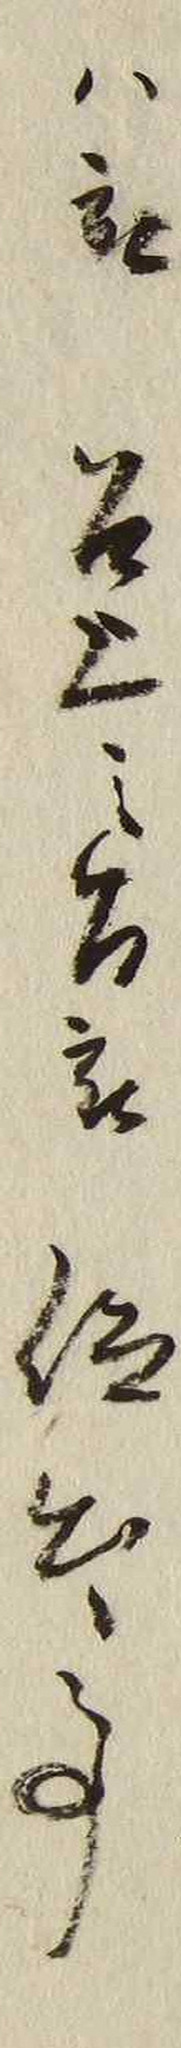ハ被召上之旨被仰出候事

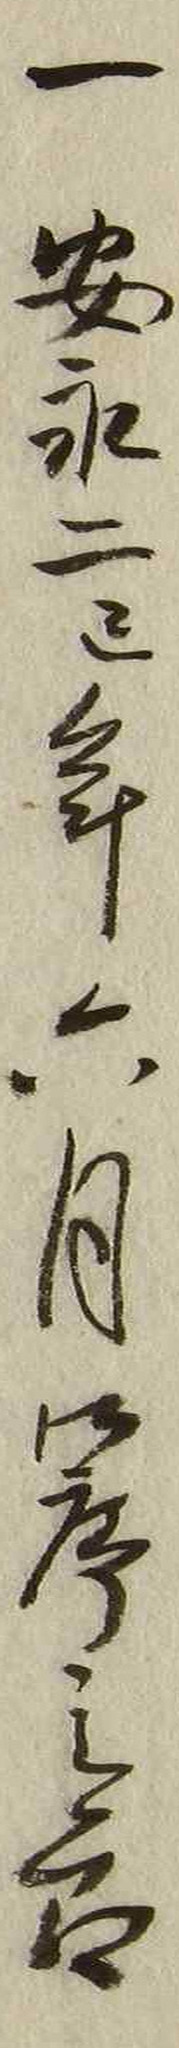一安永二巳年六月御序之節
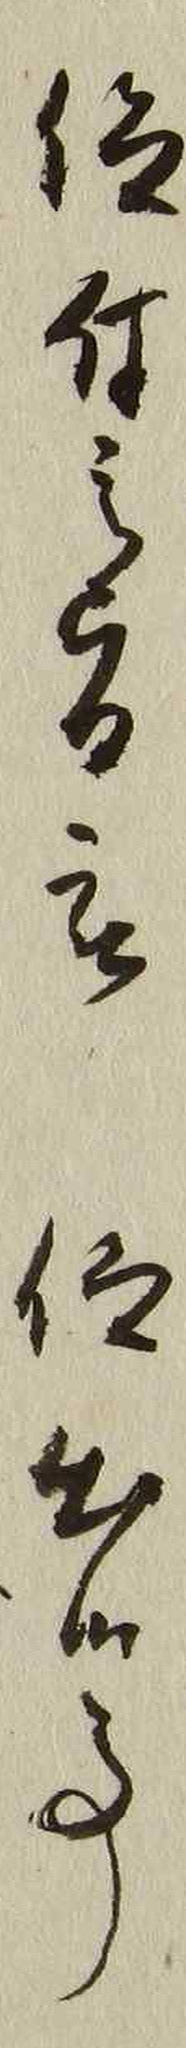仰付之旨被仰出候事
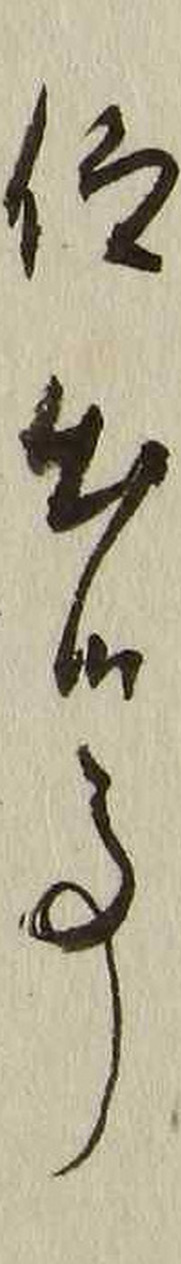仰出候事
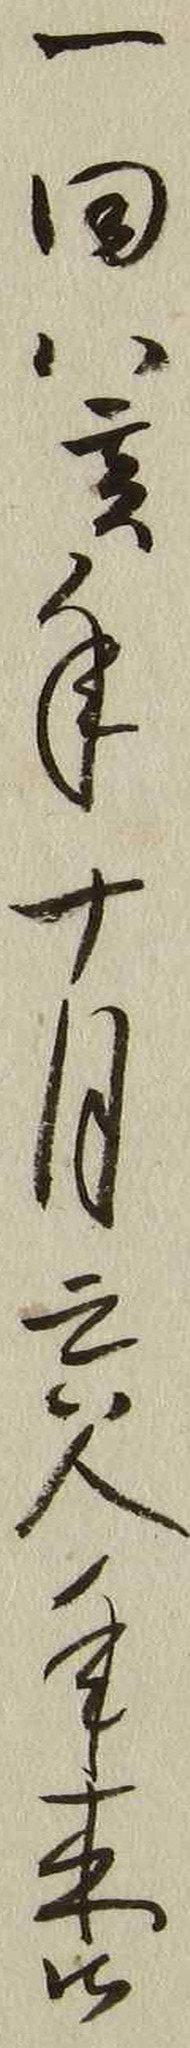一同八亥年十月亡父年来御
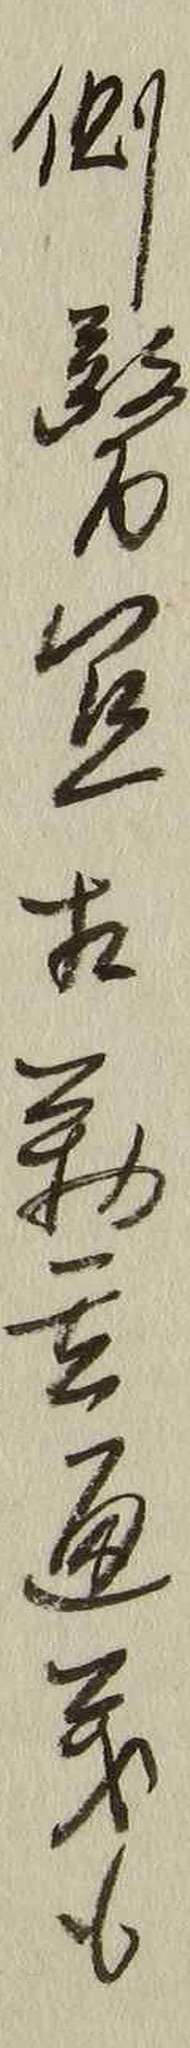側医宜相勤玄通義も
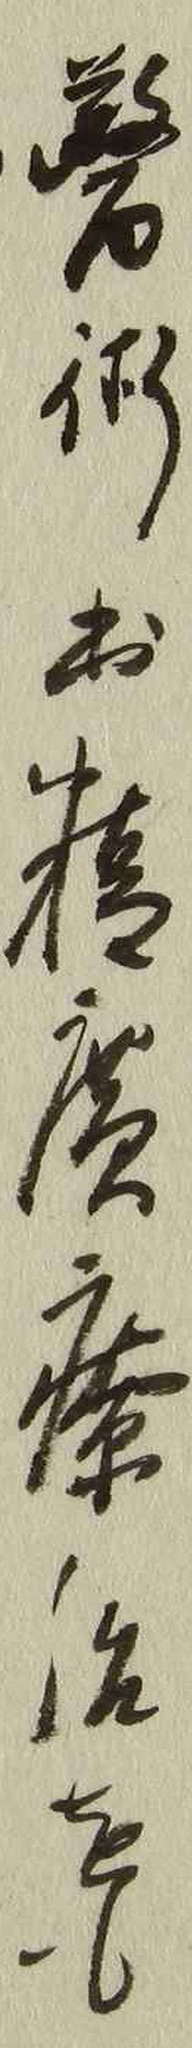医術出精広療治をも
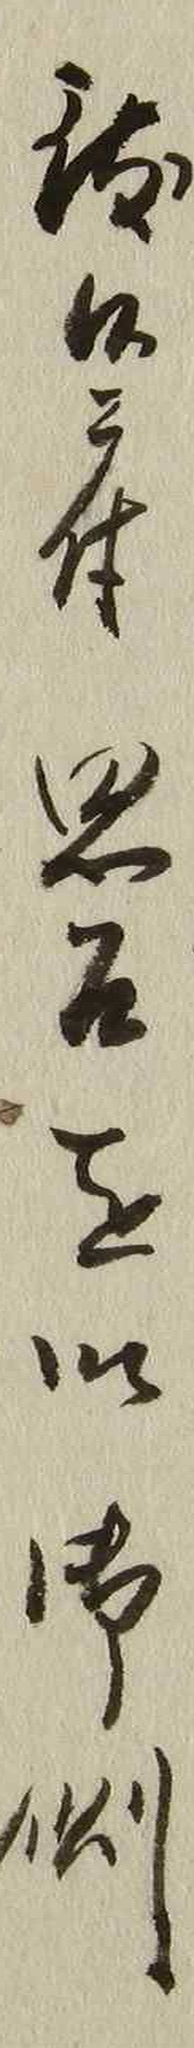致候ニ付思召を以御側
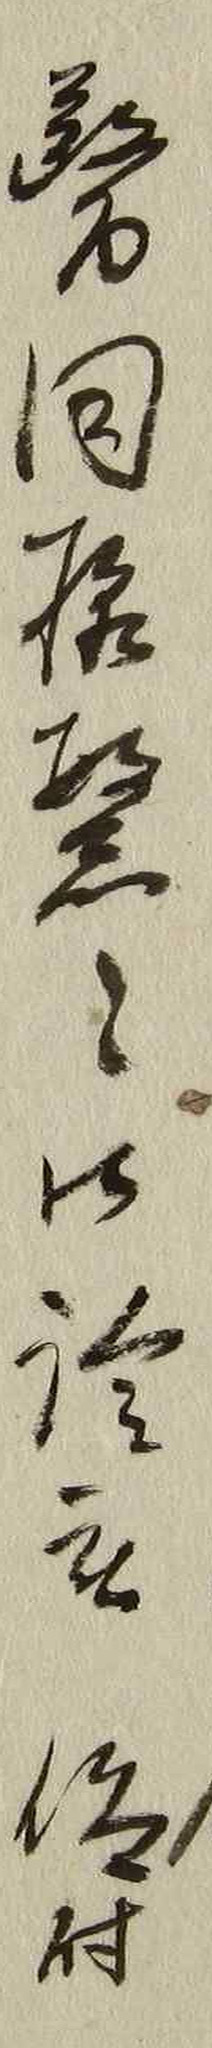医同様繁々御診被仰付
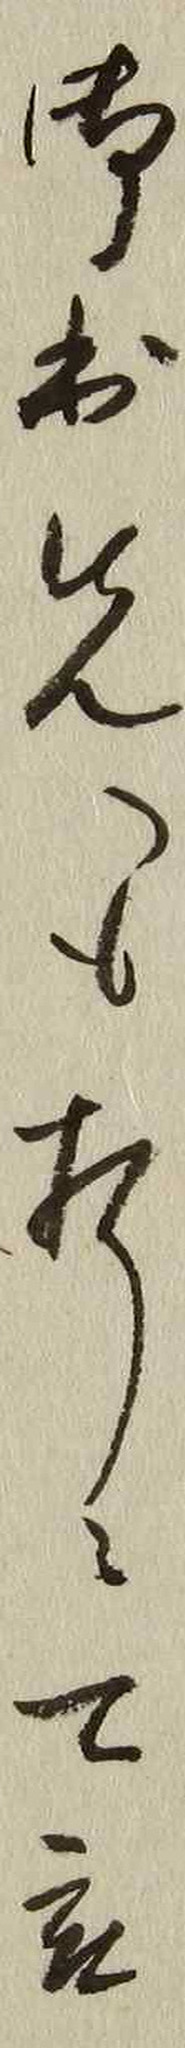御出先へ折々可被
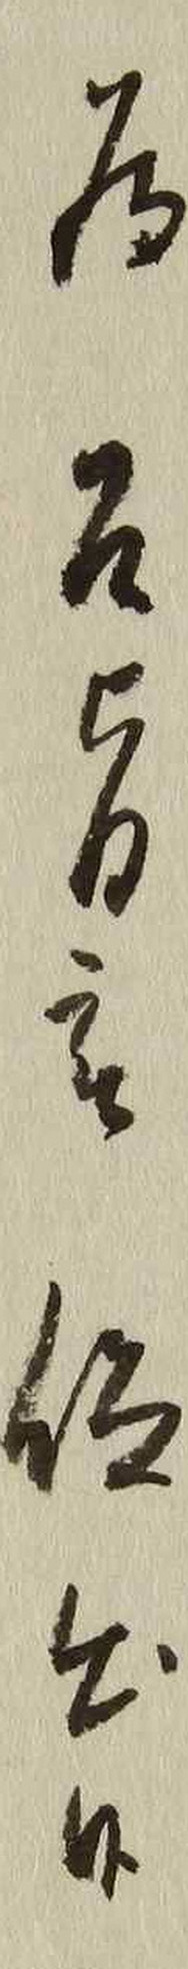為召旨被仰出候
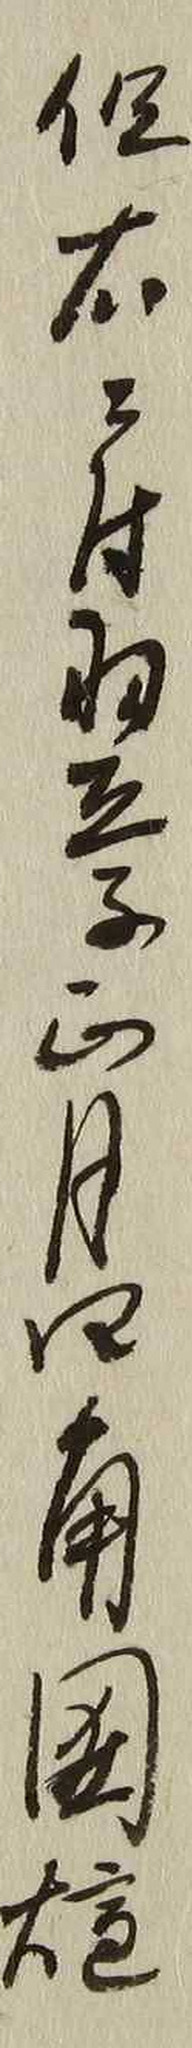但右ニ付翌子正月四角囲炉
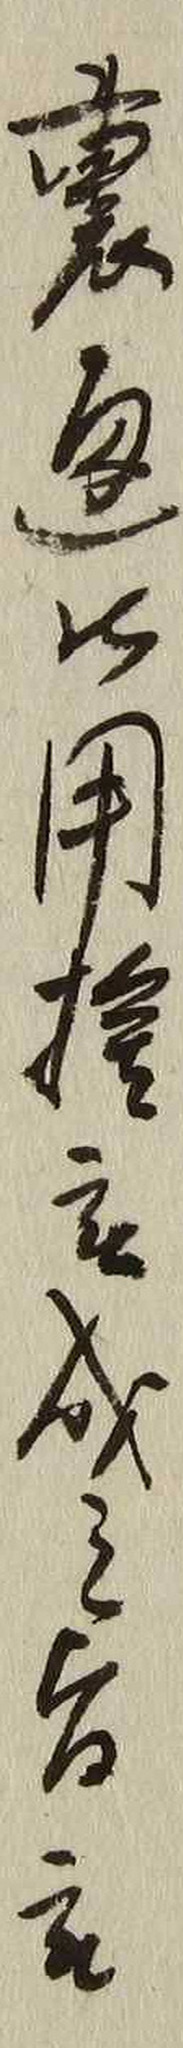裏通御用捨被成之旨被
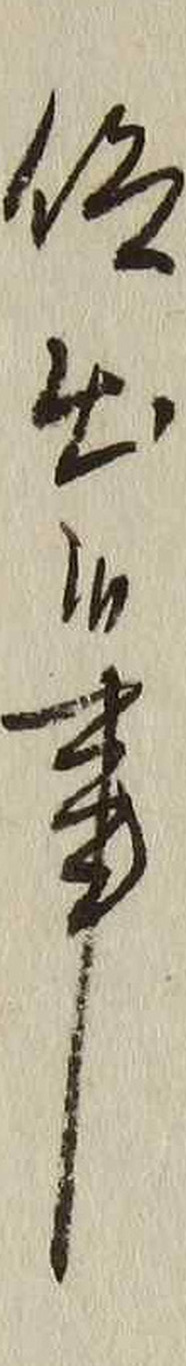仰出候事
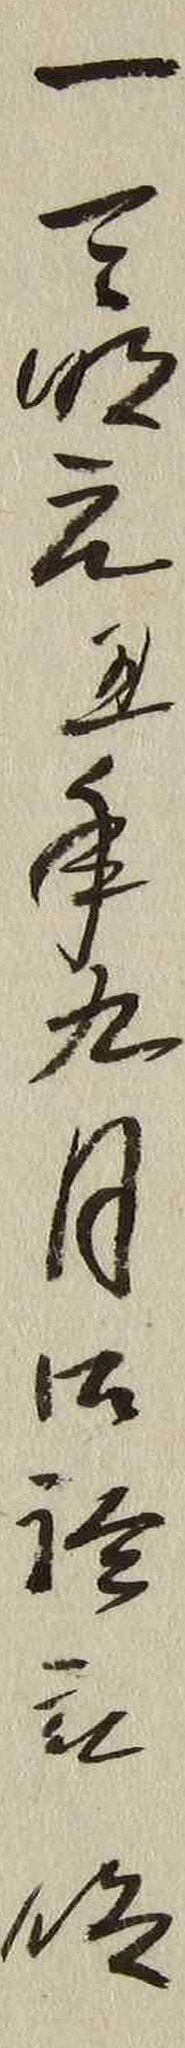一天明元丑年九月御診被仰
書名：諸士系譜　巻之353　す之部3
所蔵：会津若松市立会津図書館
